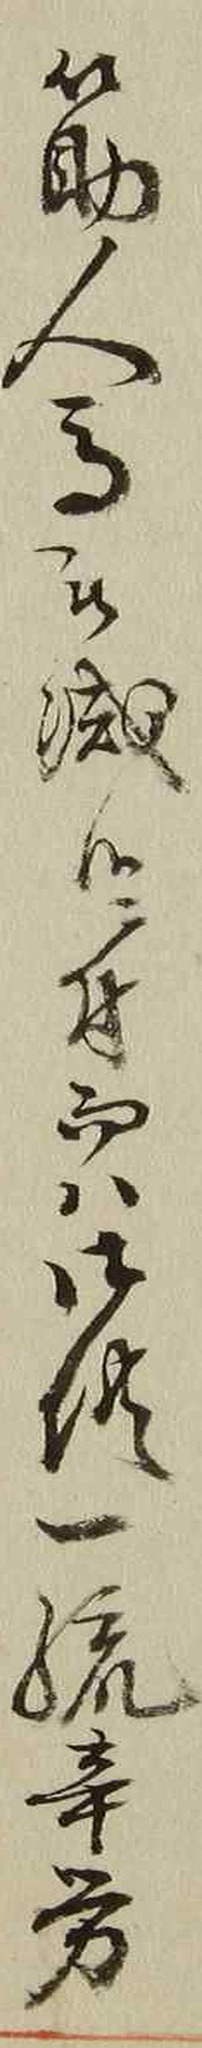筋人馬被減候ニ付而ハ御供一統辛労
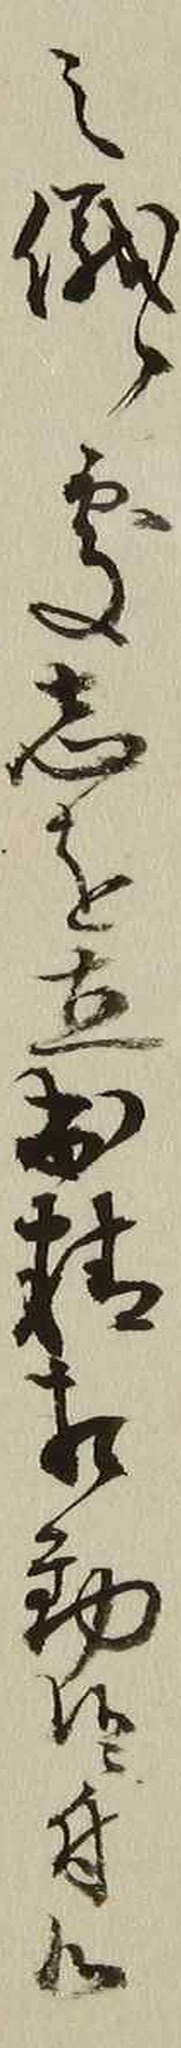之義候処志を立出精相勤候ニ付御
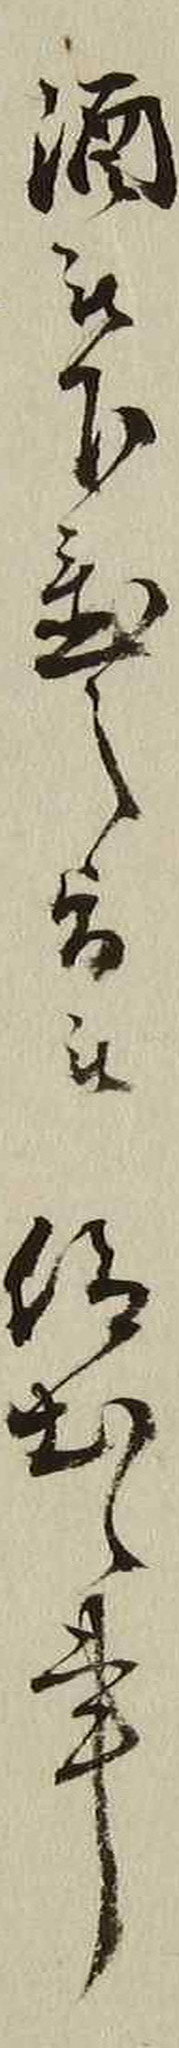酒被下置之旨被仰出候事
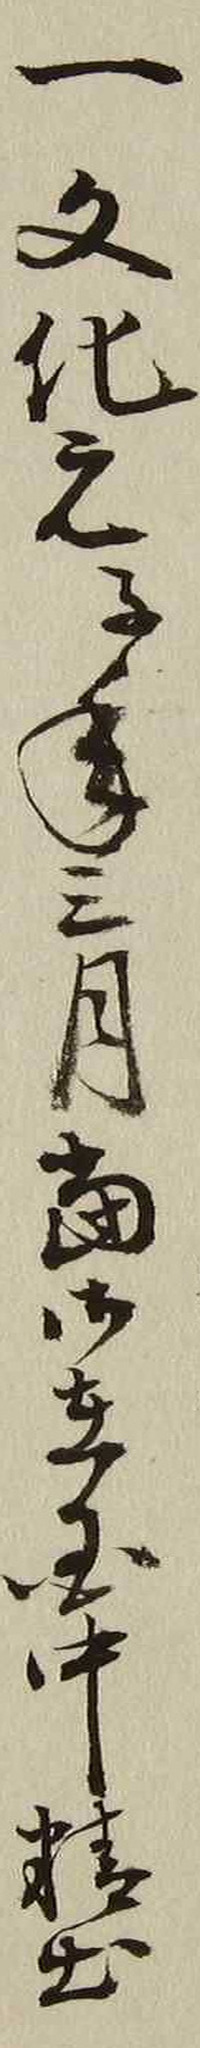一文化元子年三月当御在国中精出
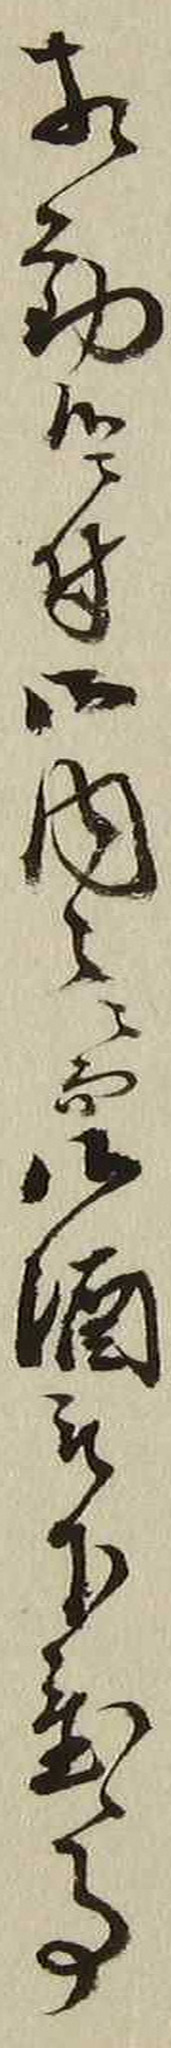相勤候ニ付御内々ニ而御酒被下置候事
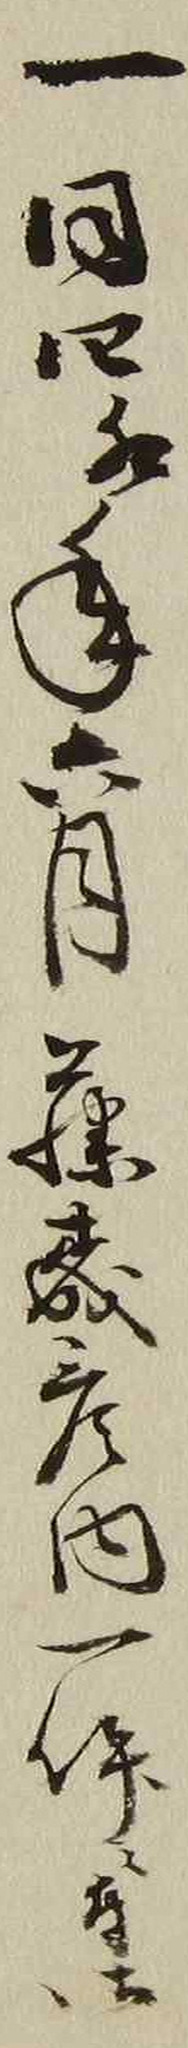一同四卯年六月藤森彦内一件ニ付御
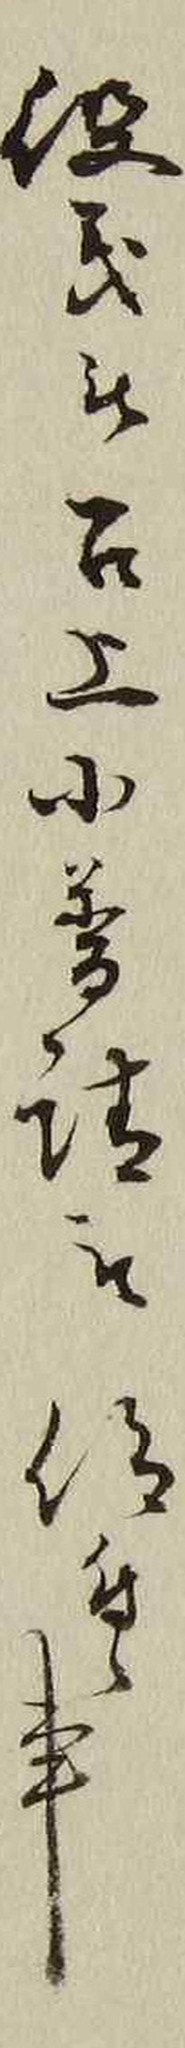役義被召上小普請被仰付候事
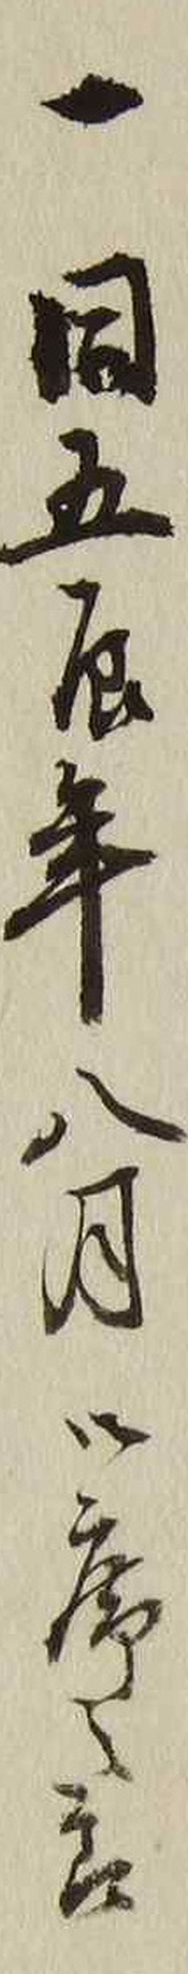一同五辰年八月御席之節
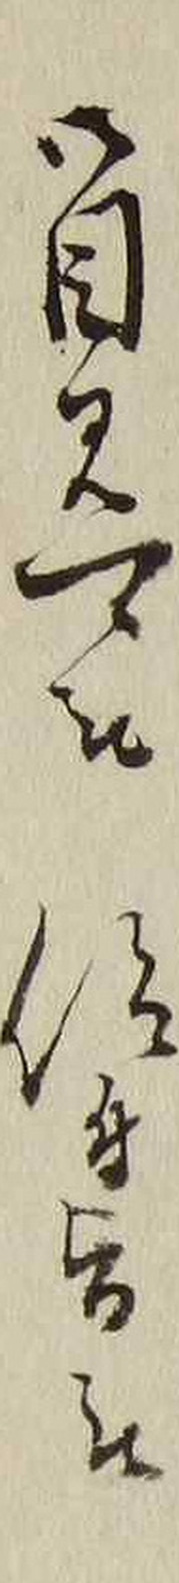御目見可被仰付旨被
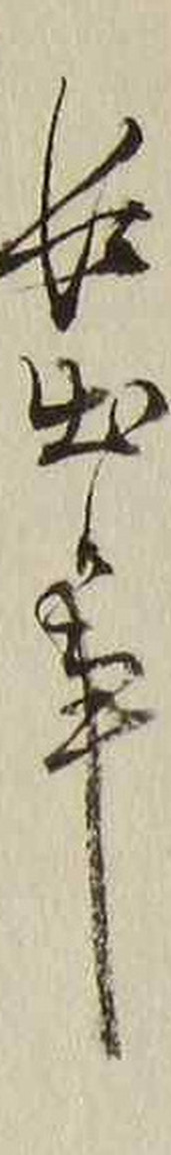長出候事
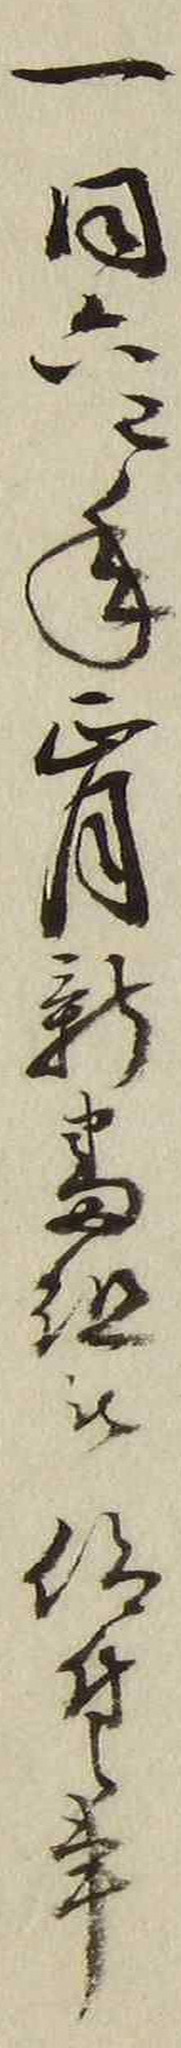一同六巳年正月新番組被仰付候事

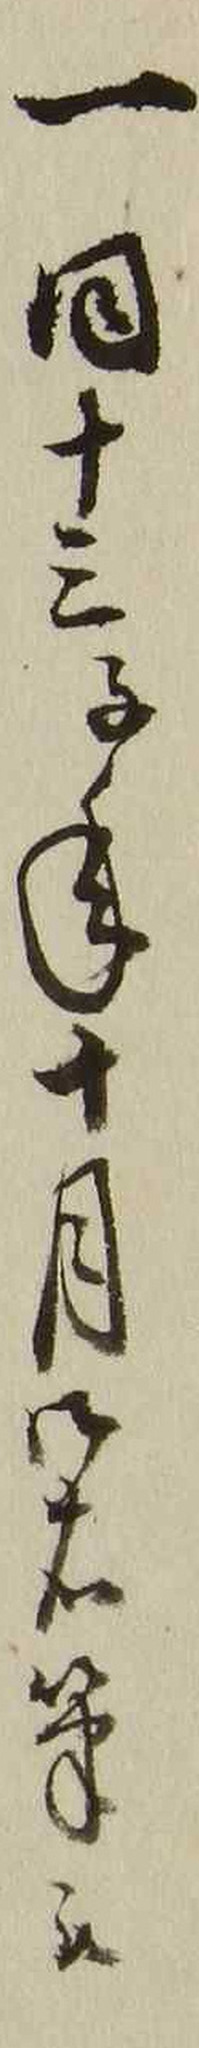一同十三子年十月御右筆被
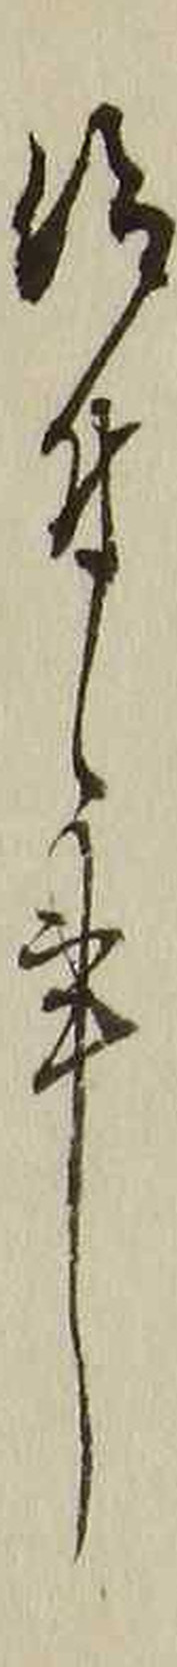仰付候事
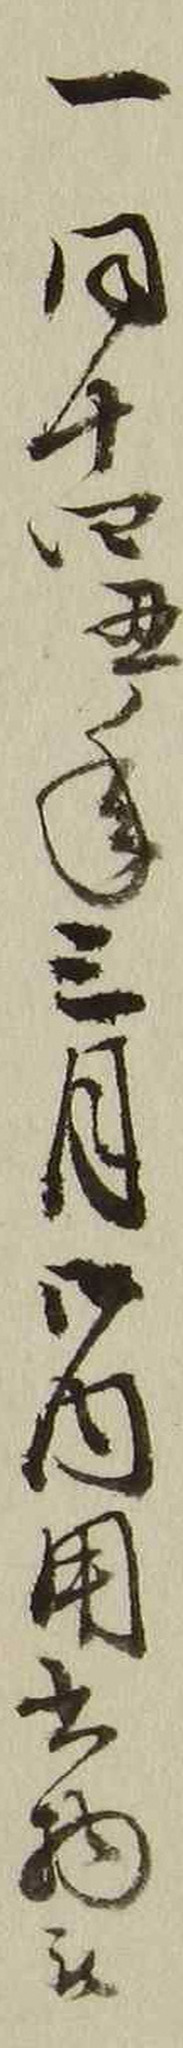一同十四丑年三月御内用書物被
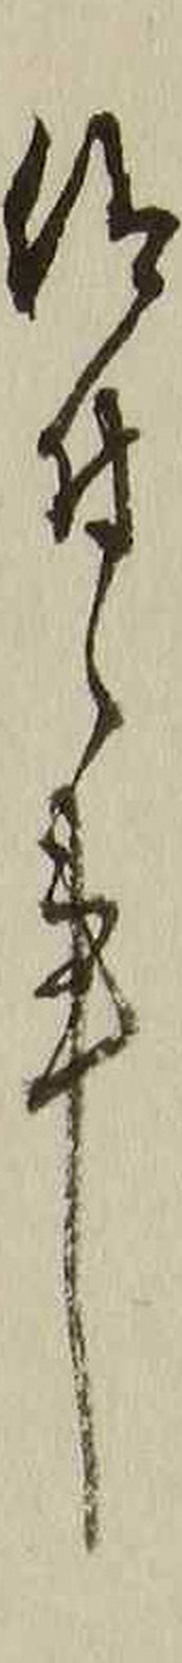仰付候事
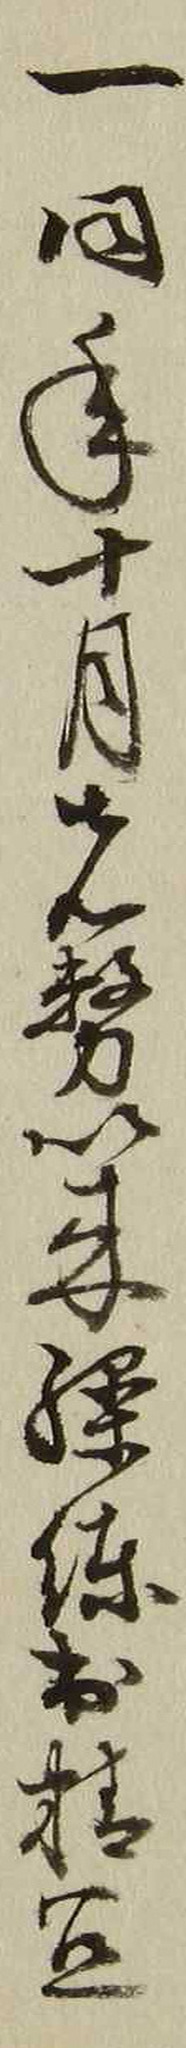一同年十月先務以来繰練出精宜
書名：諸士系譜　巻之36　は之部4
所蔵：会津若松市立会津図書館
